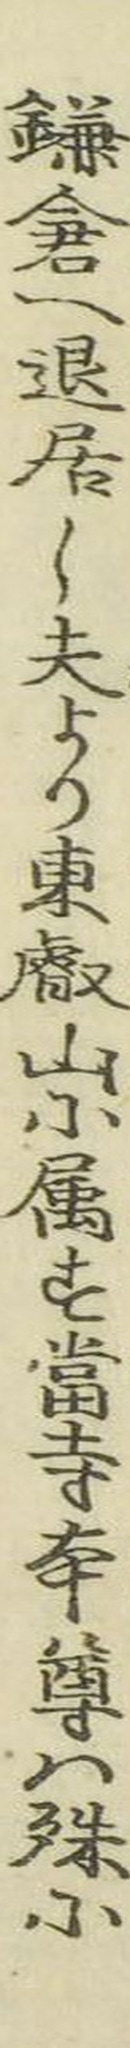鎌倉へ退居し夫より東叡山に属す当寺本尊は殊に
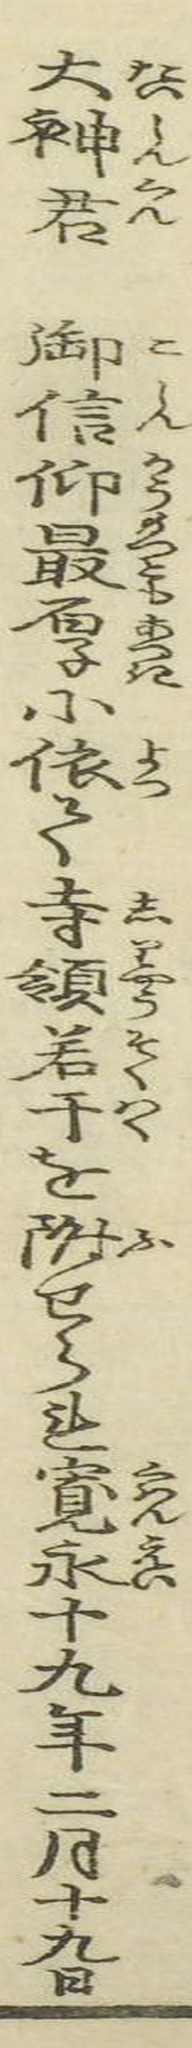大神君御信仰最厚に依て寺領若干を附せられ寛永十九年二月十九日
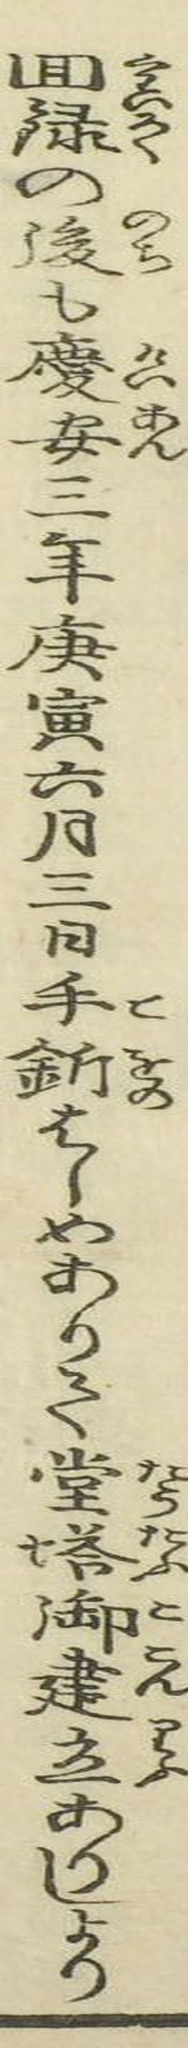回禄の後も慶安三年庚寅六月三日手釿はしめありて堂塔御建立ありしより
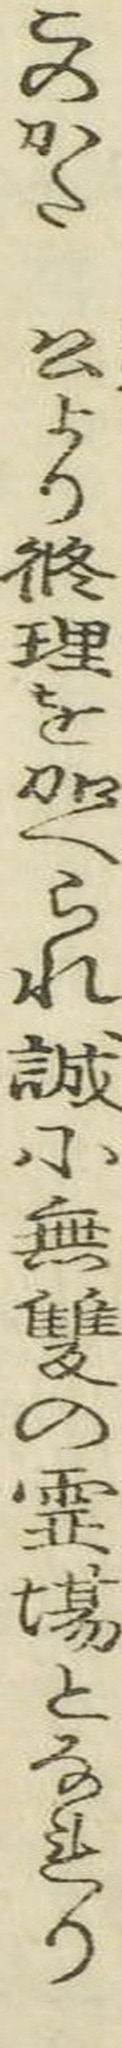このかた公より修理を加へられ誠に無双の霊場となれり
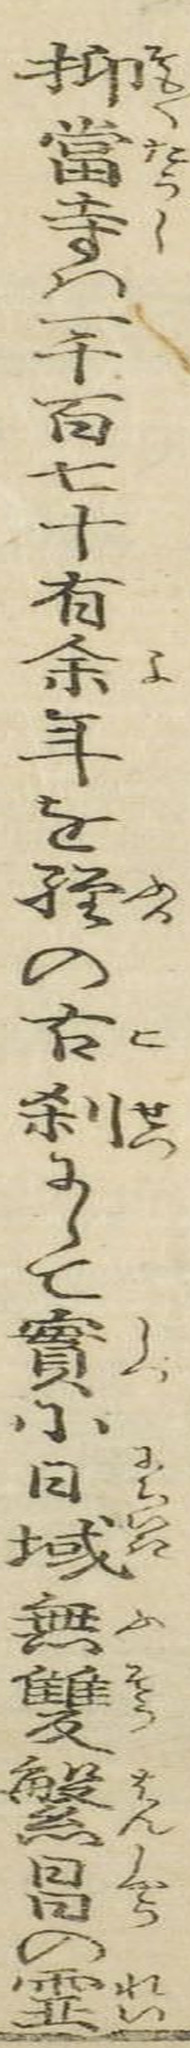抑当寺は一千百七十有余年を経の古刹にして実に日域無双繁昌の霊
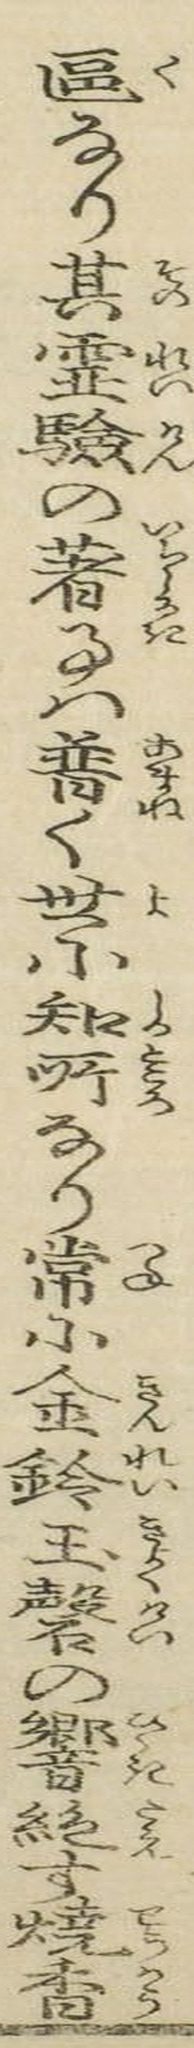区なり其霊験の著事は普く世に知所なり常に金鈴玉磬の響絶す焼香
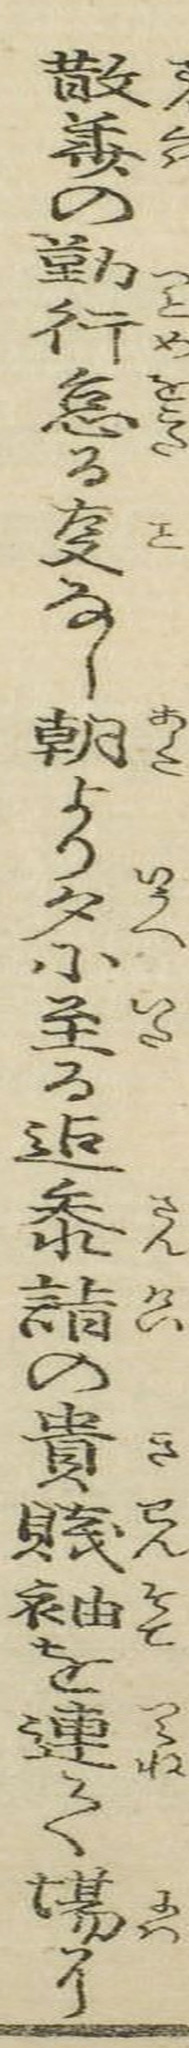散華の勤行怠る事なし朝より夕に至る迄参詣の貴賤袖を連て場に
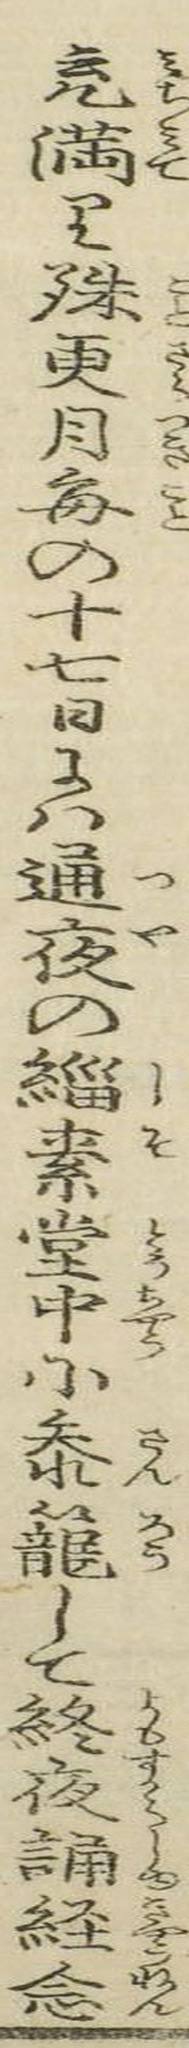充満り殊更月毎の十七日には通夜の緇素堂中に参籠して終夜誦経念
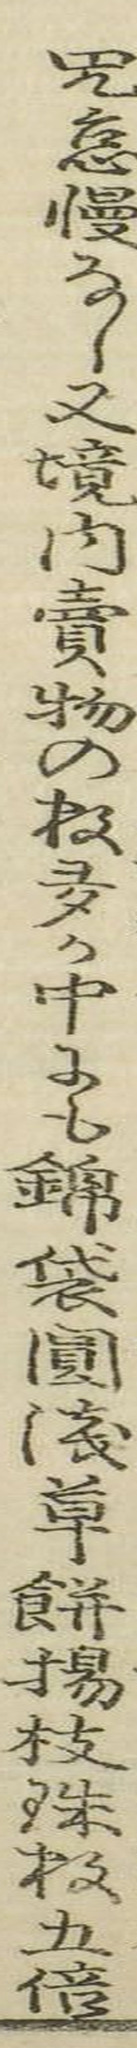咒怠慢なし又境内売物の数多か中にも錦袋円浅草餅揚枝珠数五倍
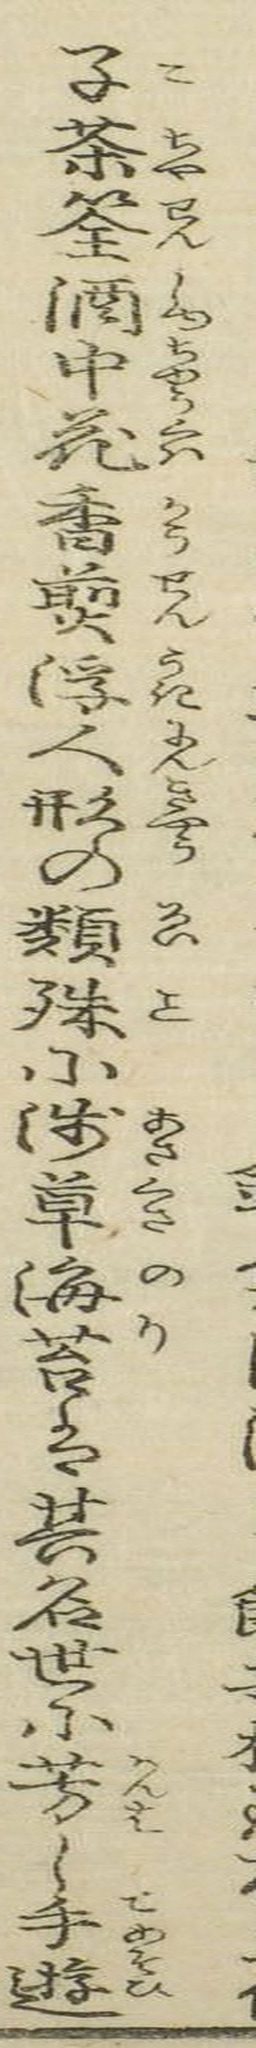子茶筌酒中花香煎浮人形の類殊に浅草海苔は其名世に芳し手遊
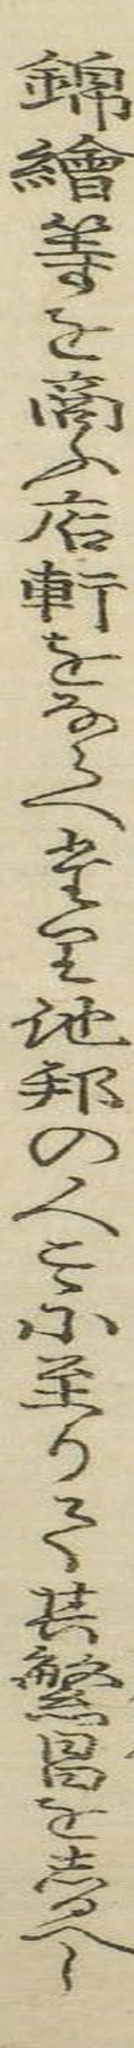錦絵等を商ふ店軒をならへたり他邦の人こゝに至りて其繁昌をしるへし
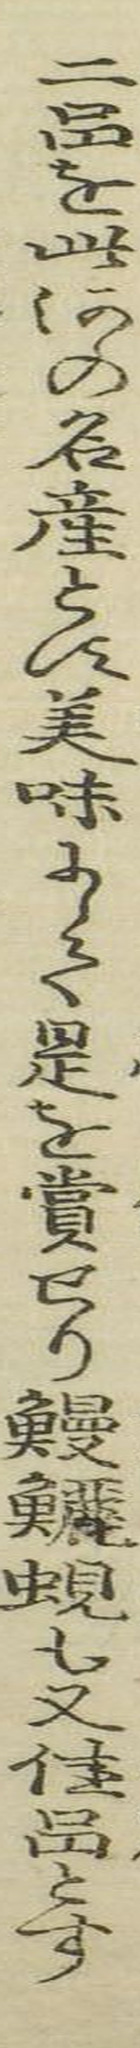二品を此河の名産とす美味にして是を賞せり鰻鱺蜆も又佳品とす

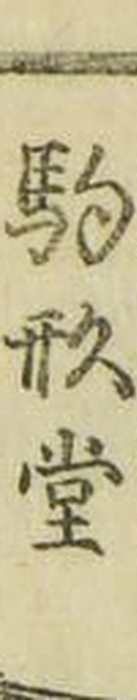駒形堂
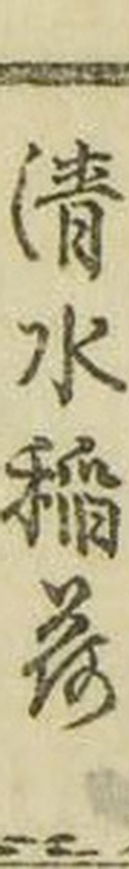清水稲荷
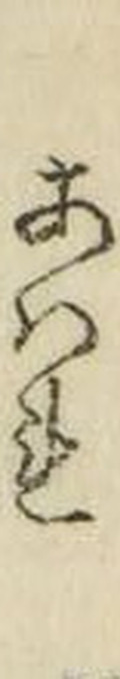あはれ
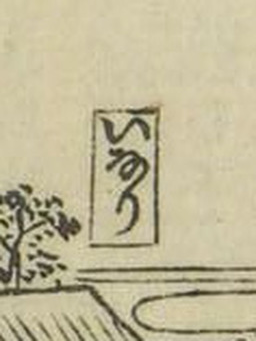いなり
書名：江戸名所図会 20巻 巻之16
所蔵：東京学芸大学教育コンテンツアーカイブ
